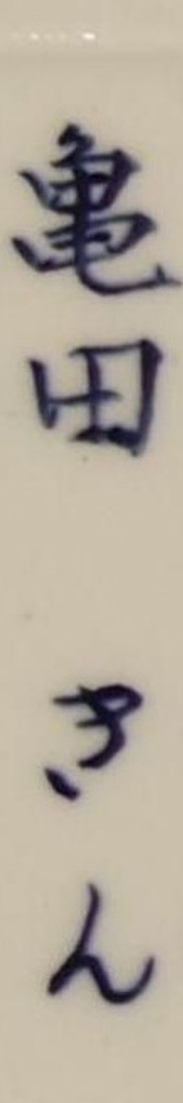亀田きん
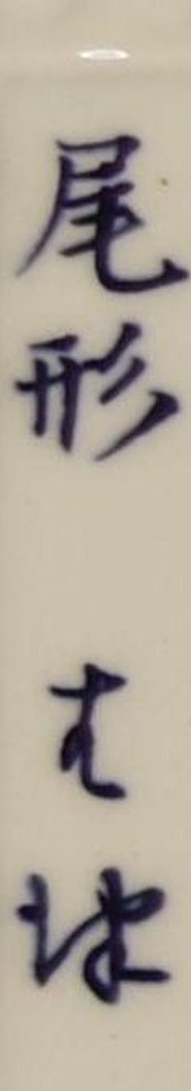尾形はつ

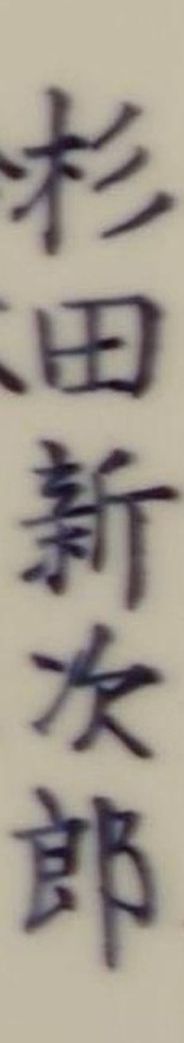杉田新次郎
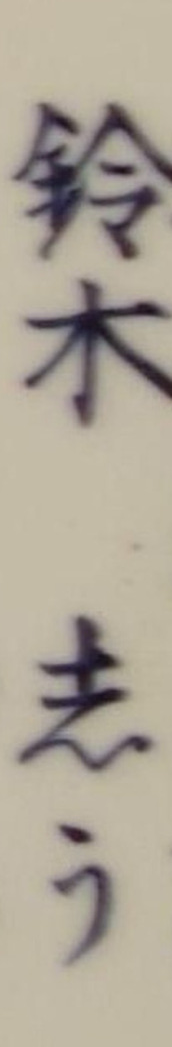鈴木しう
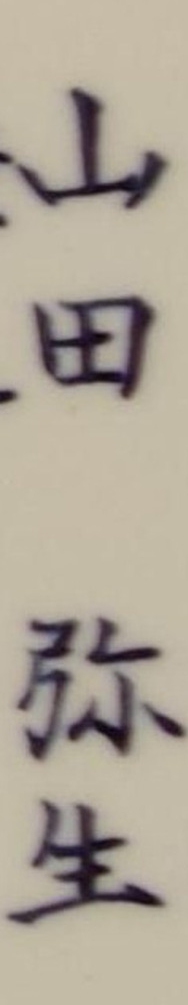山田弥生
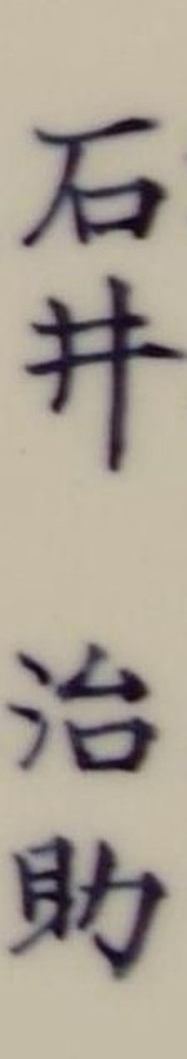石井治助
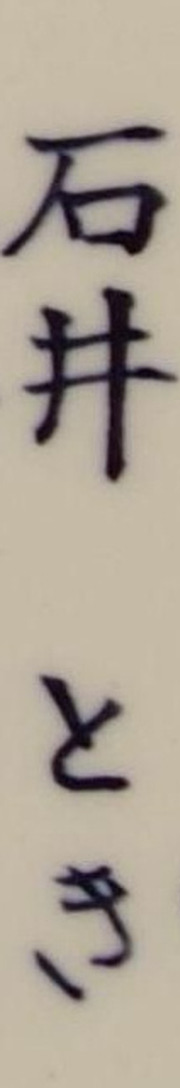石井とき
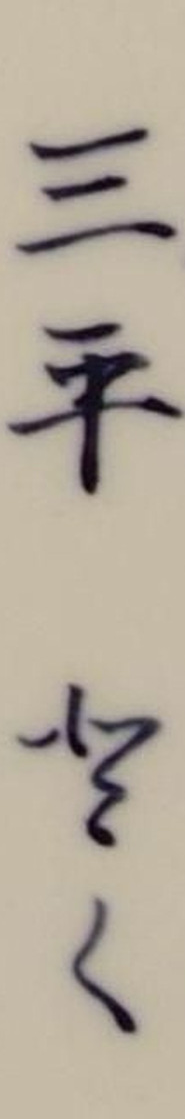三平とく
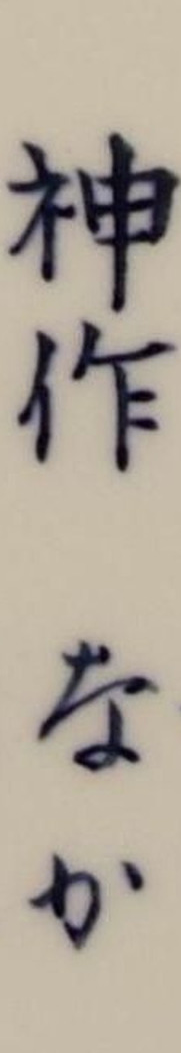神作なか
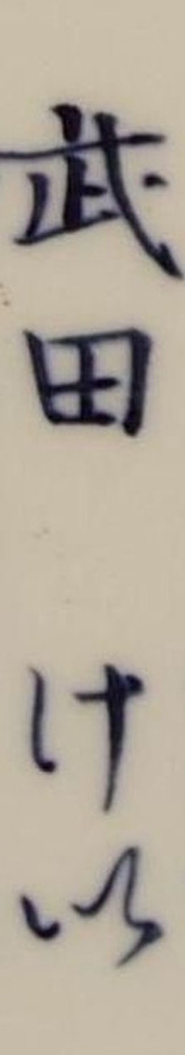武田けい
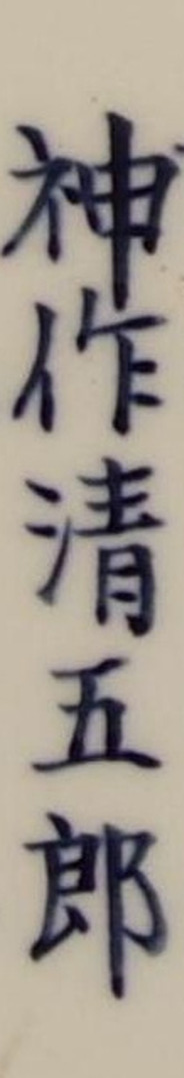神作清五郎
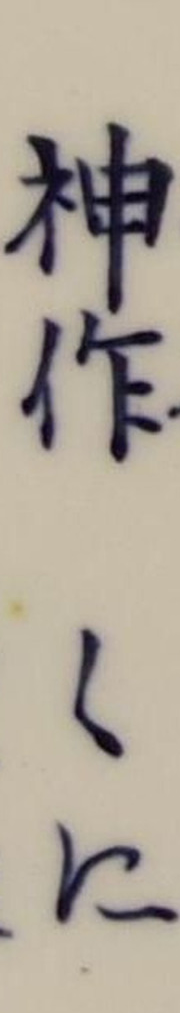神作くに
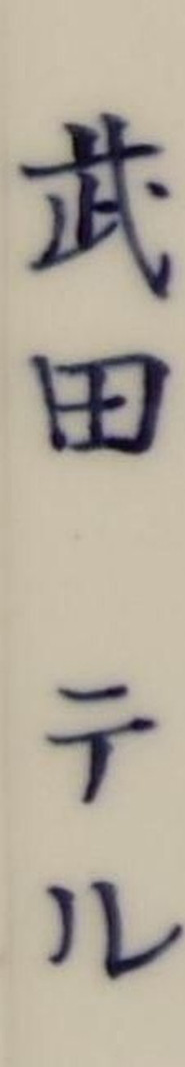武田テル

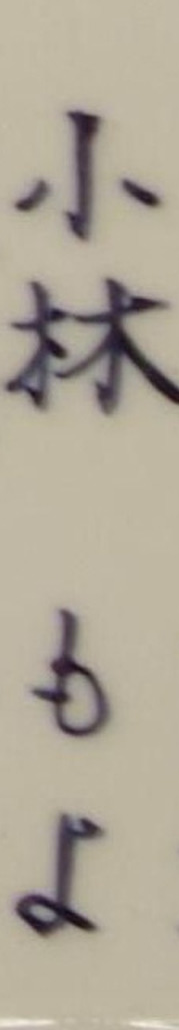小林もよ
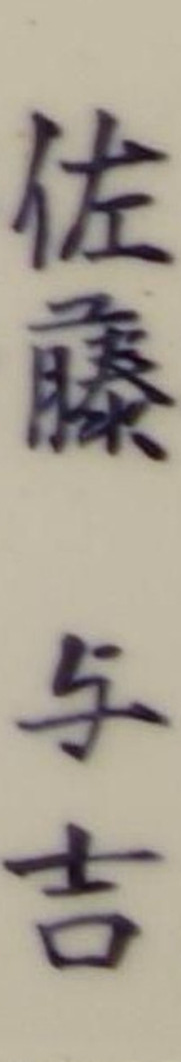佐藤与吉
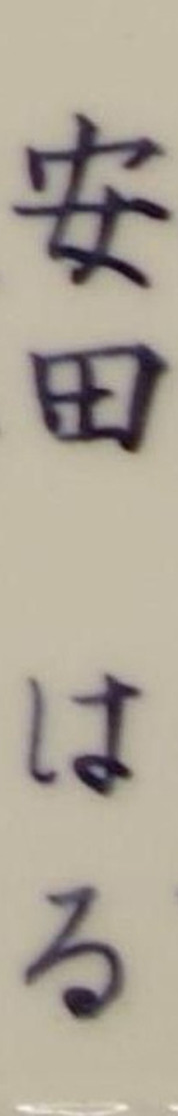安田はる
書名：E~L
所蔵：高野山金剛峯寺
